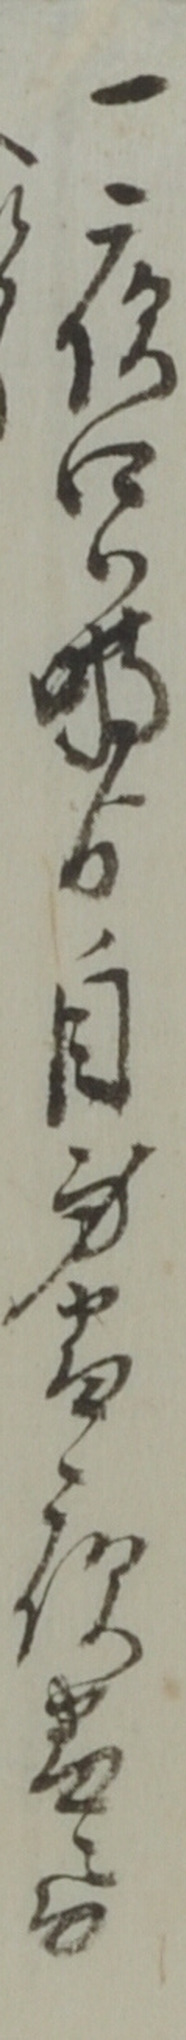一夜四ツ時ゟ自身番夜番ニ而
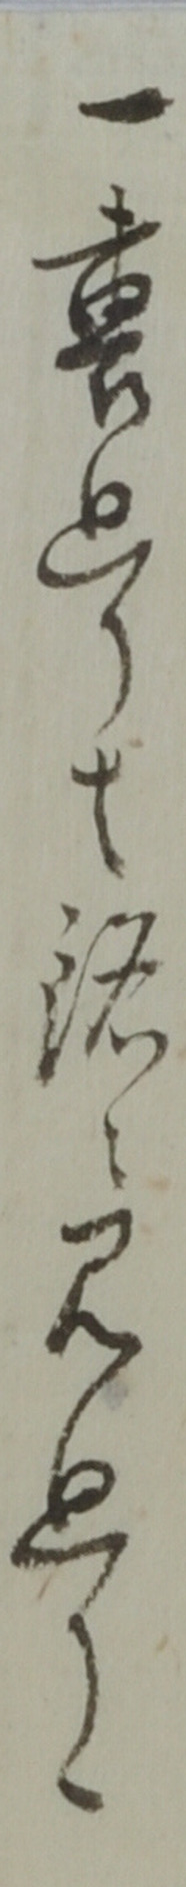一裏廻リ者銘々見廻リ候
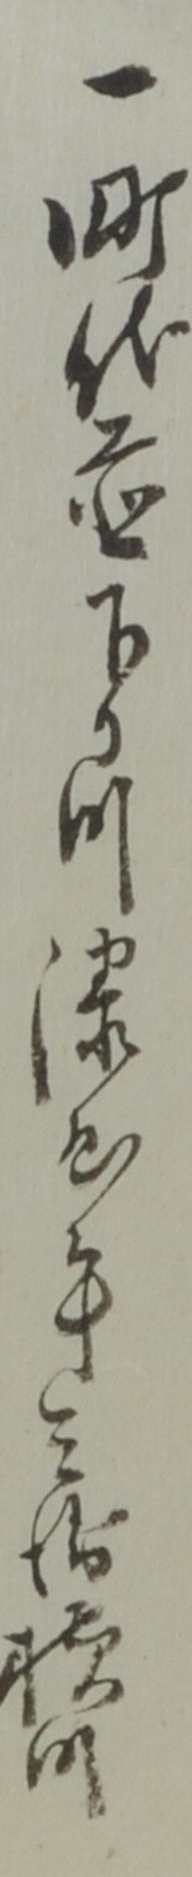一町代置下リ町漆屋平兵衛横町
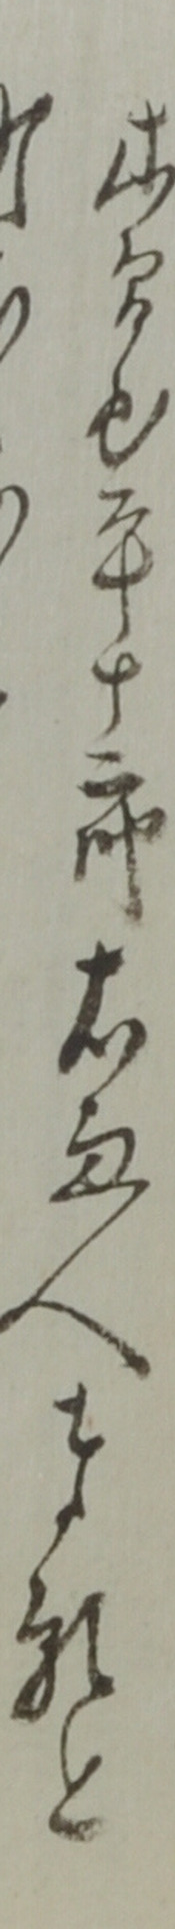木曽屋平十郎右両人奉願と
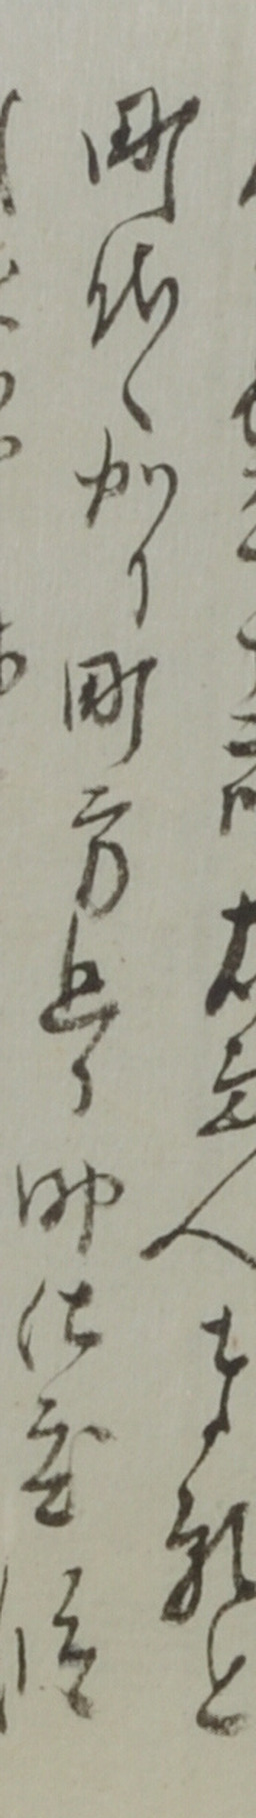町代へ加リ町方廻リ助仕度段
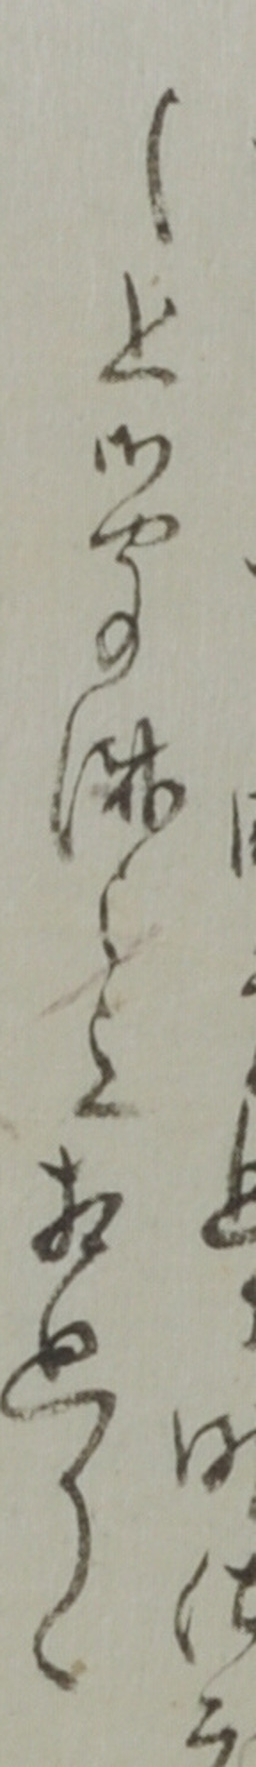之上御聞済之上相廻リ候
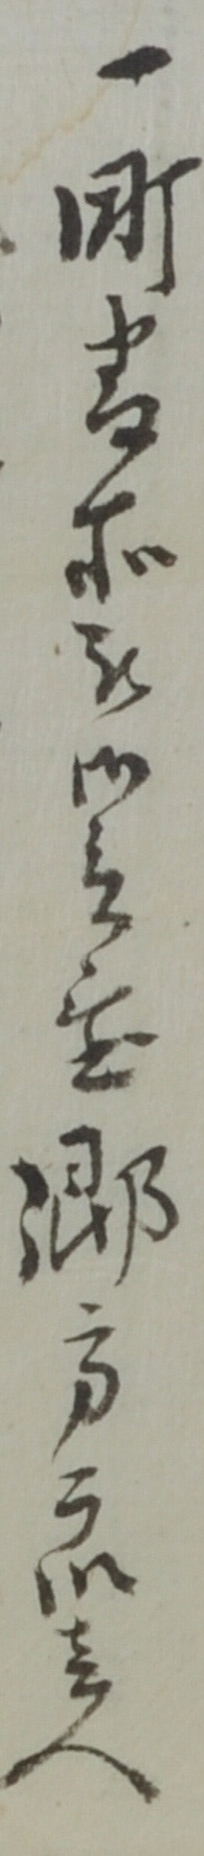一町番所罷御立置郷方衆壱人
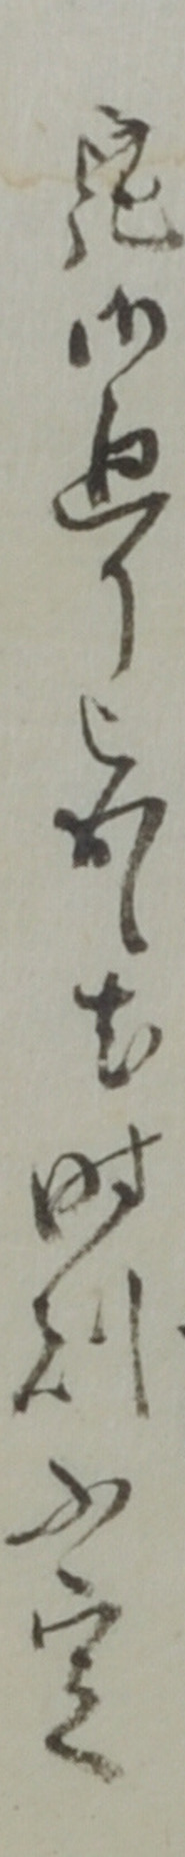宛御廻リ被成候尤時刻不定
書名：日光御参詣ニ付町方警固番割名前控
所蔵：伊那市立高遠町図書館・合同会社AMANE
